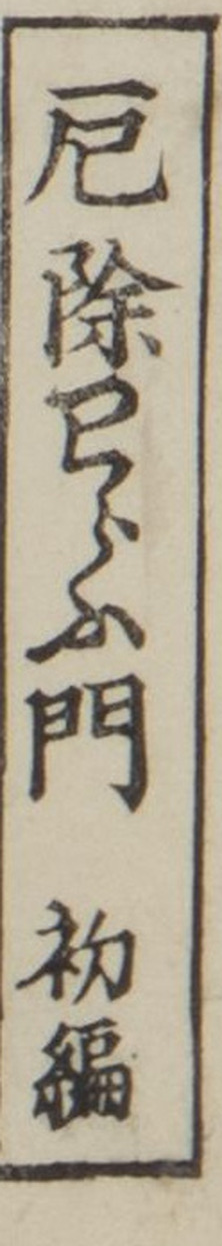厄除わらふ門初編
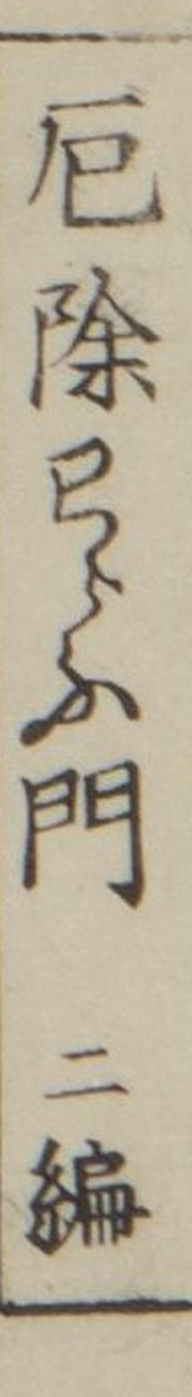厄除わらふ門二編
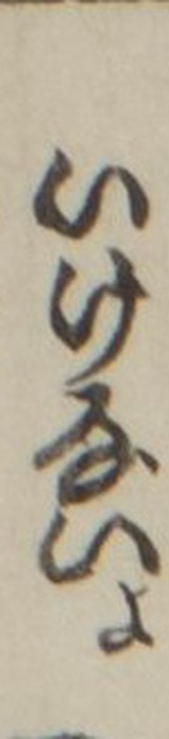かへないよ
